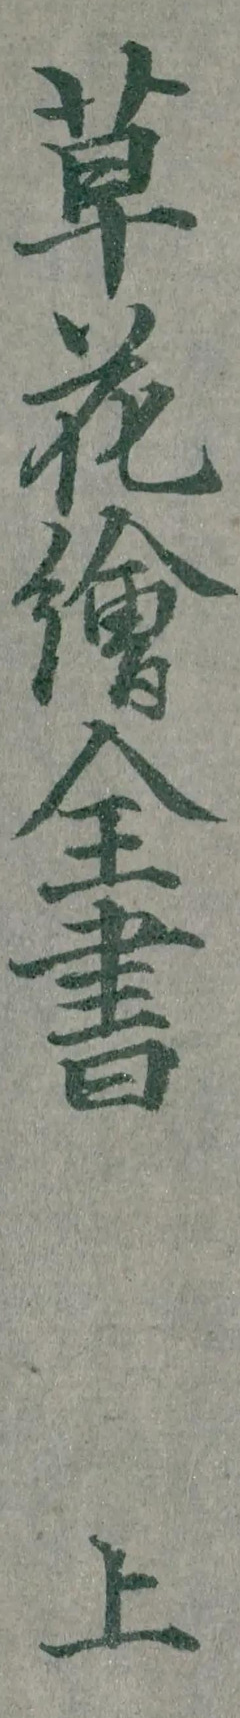草花絵全書上

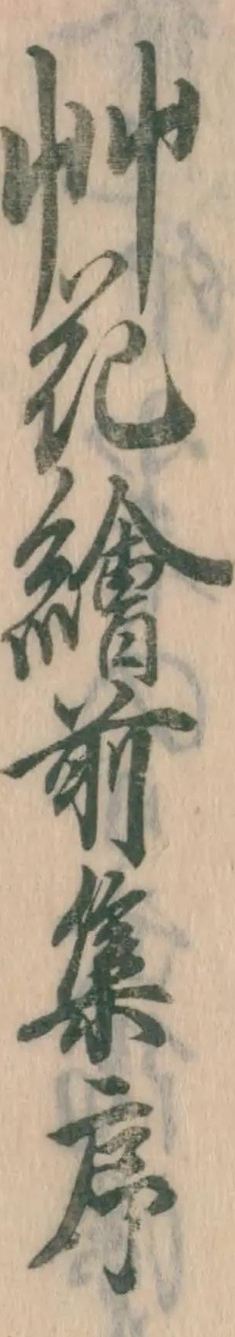艸花絵全集序
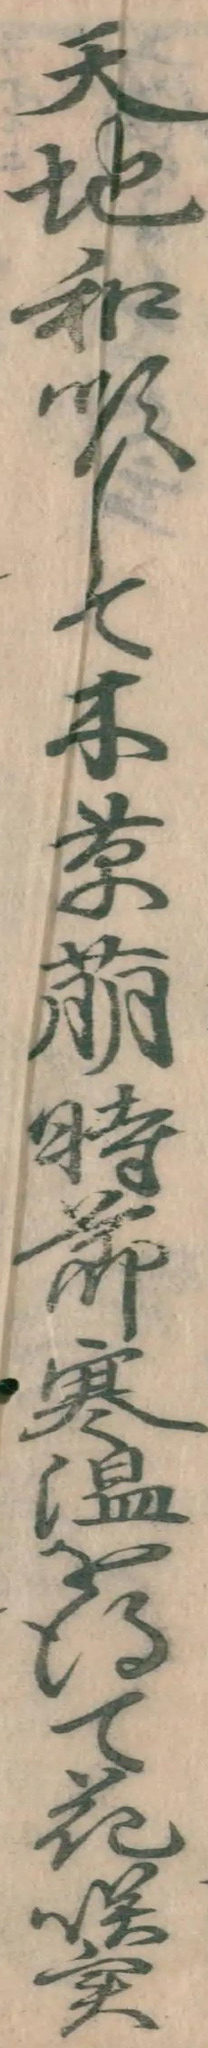天地和順して木草萌時節寒温を得て花咲実
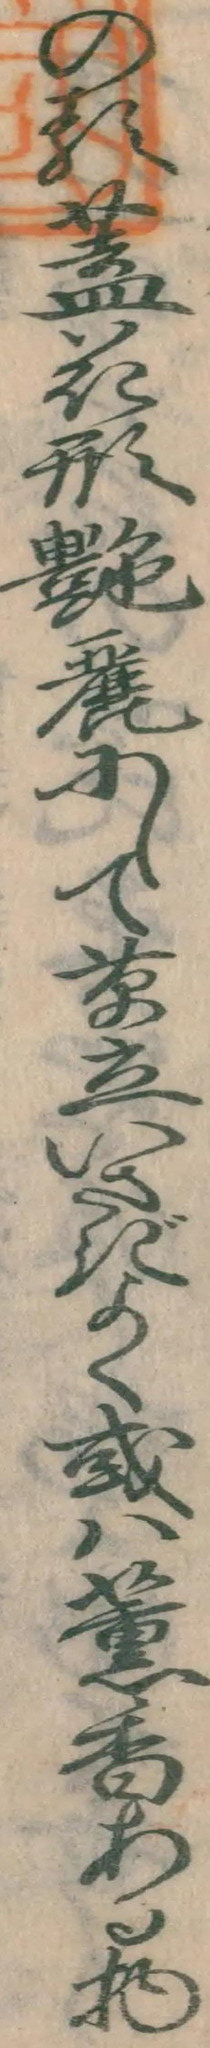の類蓋花形艶麗にして草立いさぎよく或は薫香ある物
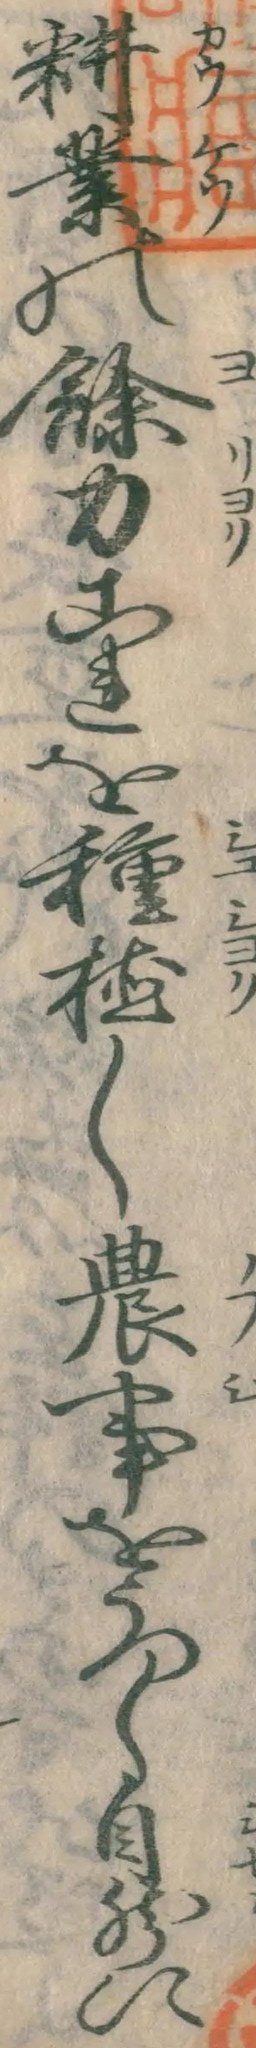耕業の余力これを種植し農事をうつし自然に
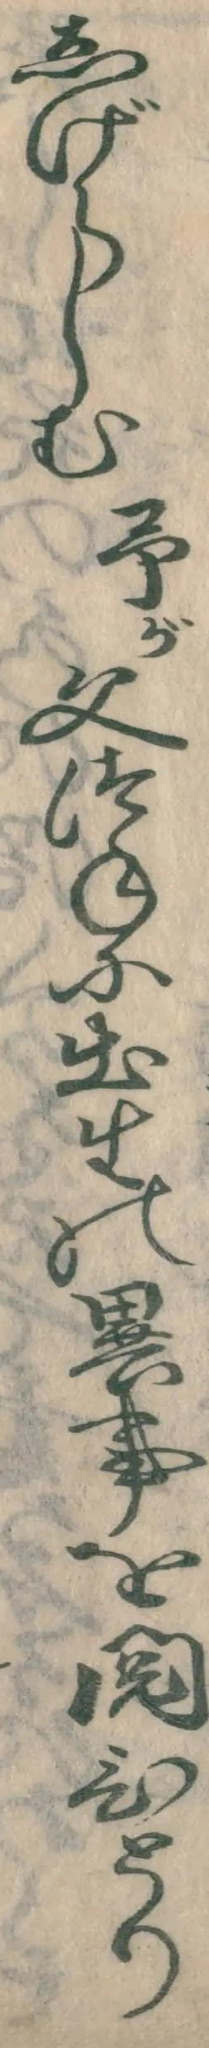しげらしむ予が父つねに出生の異事を閲ひとり
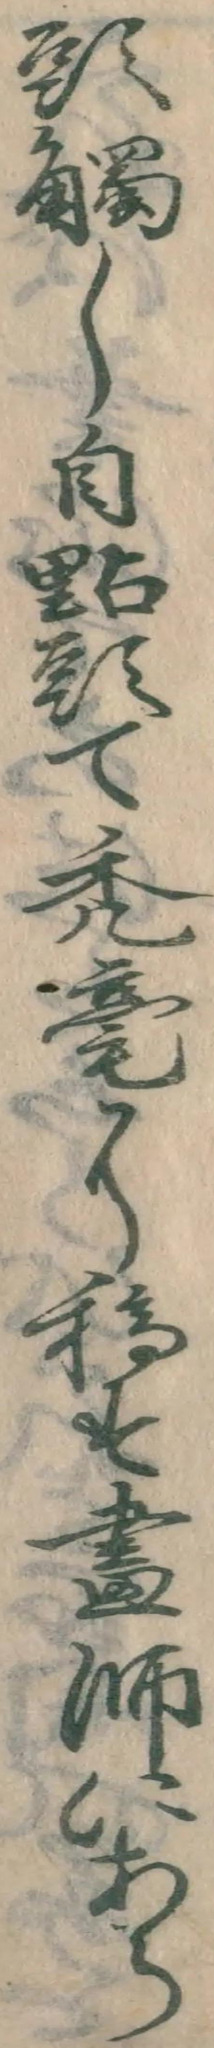頭触し自頭て禿毫に稿す画師にあら

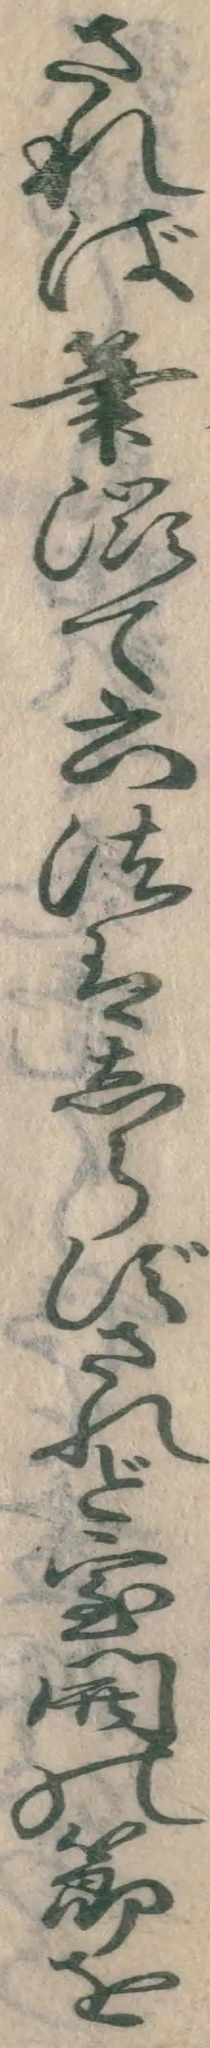されば筆渋て六法はしらずされど室開の節を
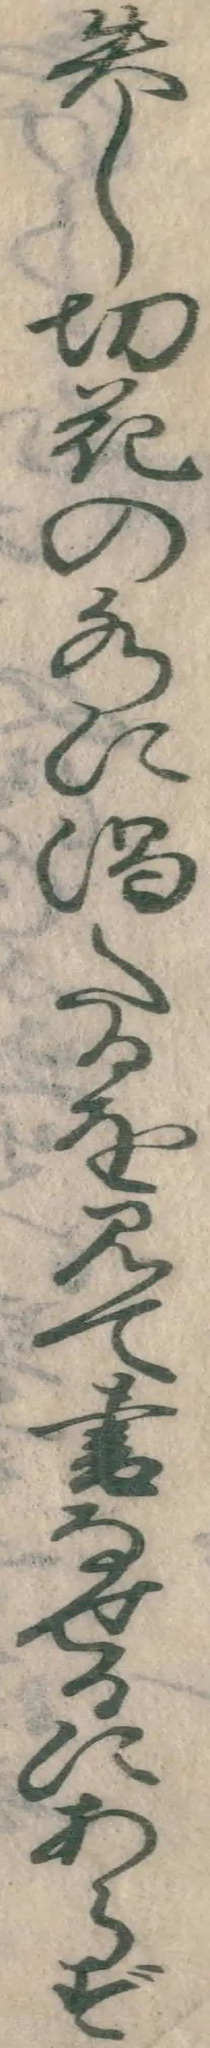失し切花の水に渇たるを見て書なせるにあらず
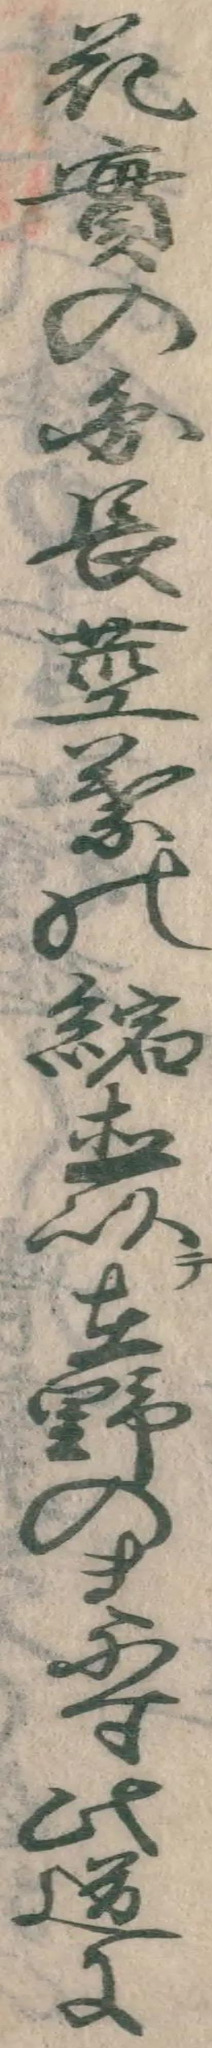花実の円長茎葉の縮直以て在野のまゝにす此道に
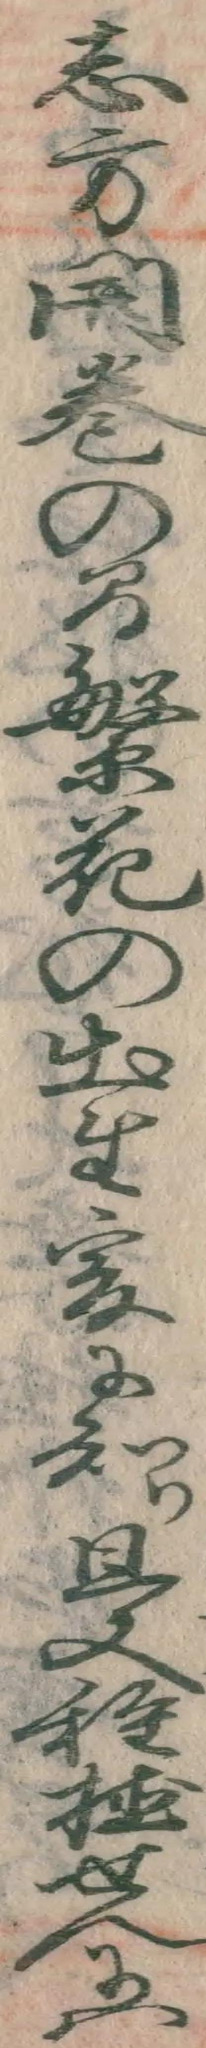志方開巻の間繁花の出生爰に知り且又種植せんには
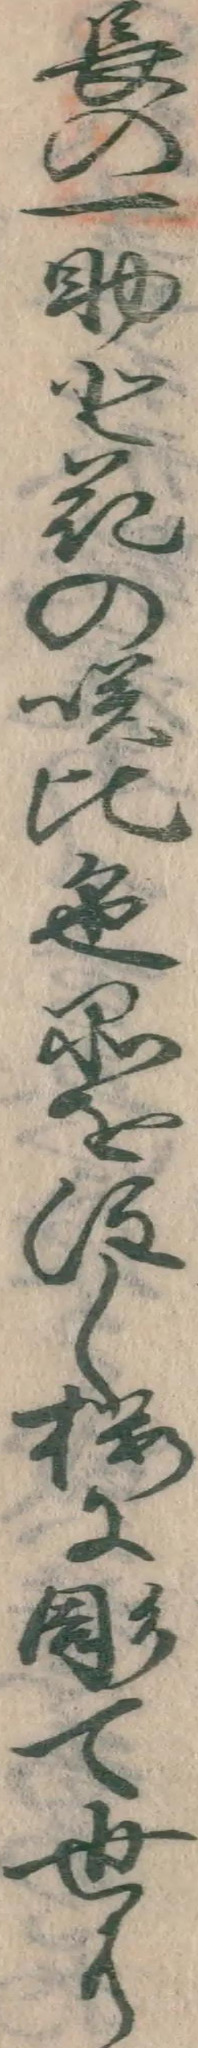長の一助と花の咲比色品を注し桜に彫て世に
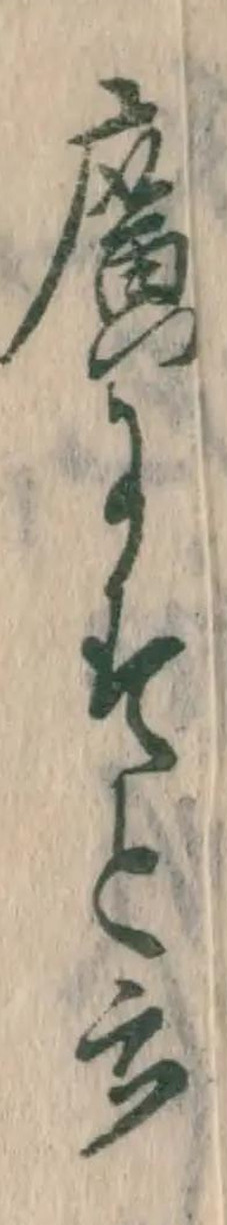広にすと言
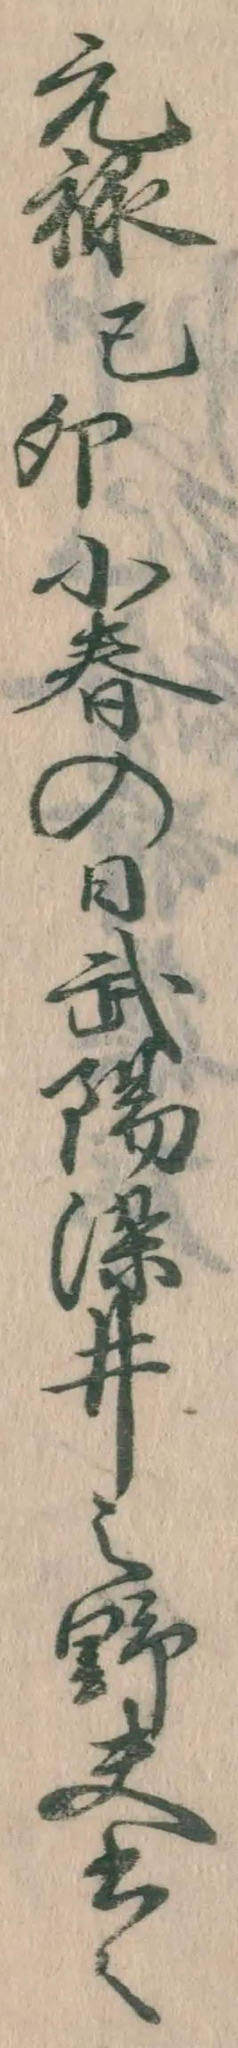元禄己卯小春の日武陽染井之夫書之
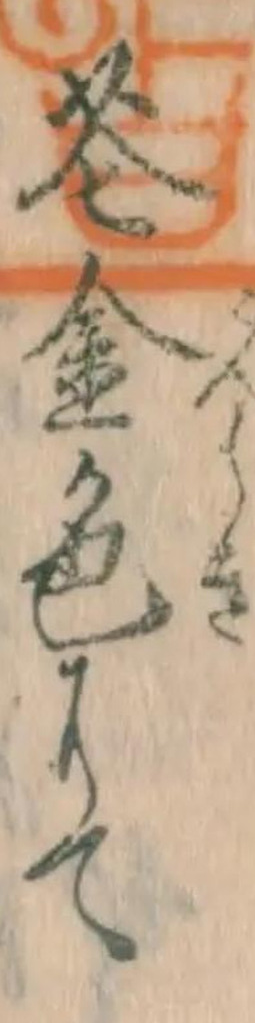花金色にて
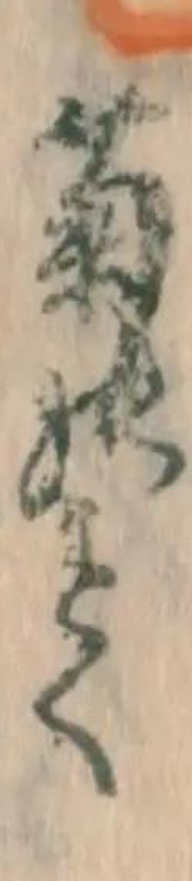菊のことく
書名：艸花繪前集. [1]
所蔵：国立国会図書館 National Diet Library, JAPAN
